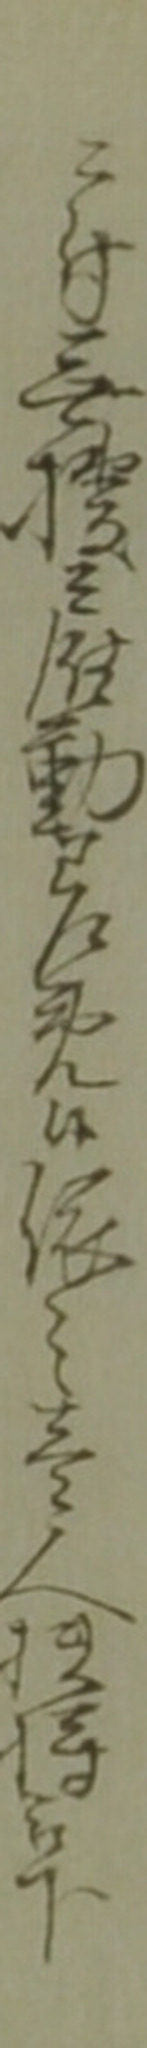ニ付無拠雇勤差免候依之壱人扶持被下
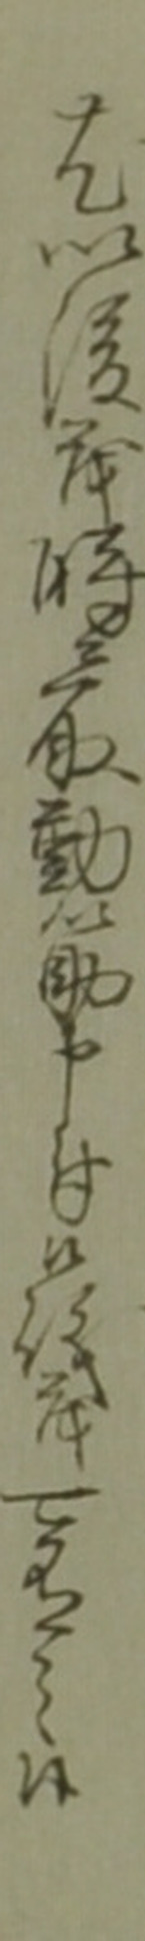尤以後茂時ニ取勤筋申付候儀茂可有之候
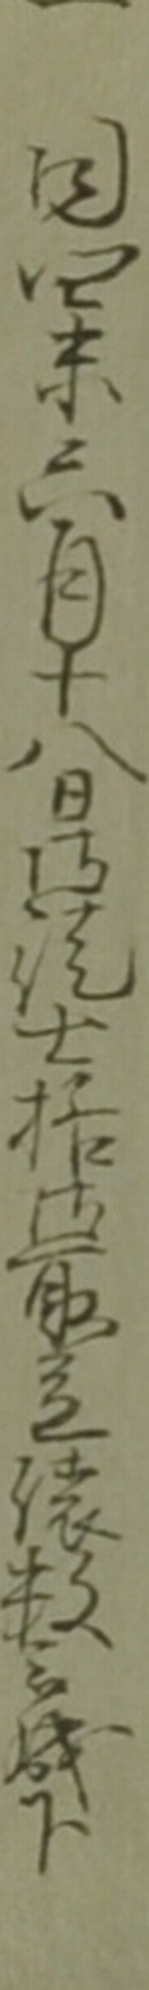一同四未六月十八日御徒士格御取立俵数被成下
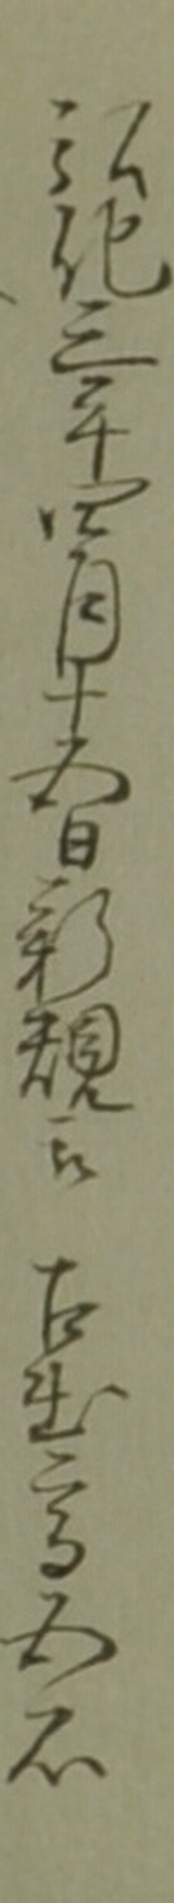一弘化三午四月十五日新規被召出高五石
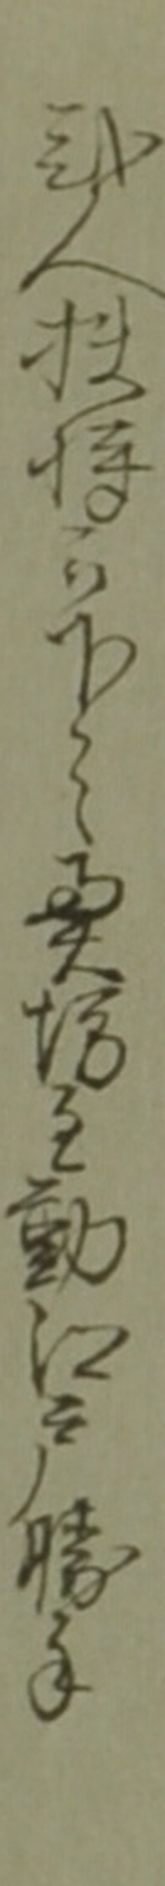弐人扶持被下之奥坊主勤江戸勝手
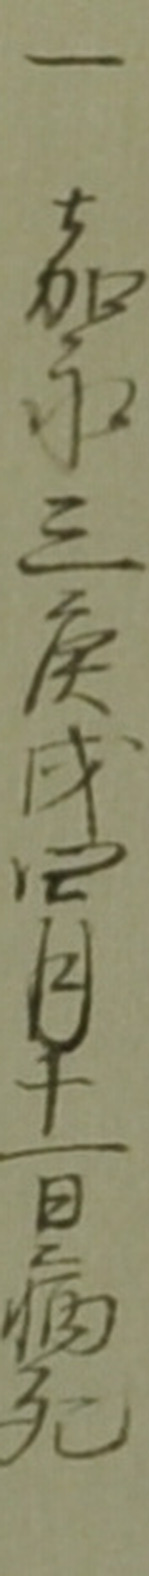一嘉永三庚戌四月十一日病死
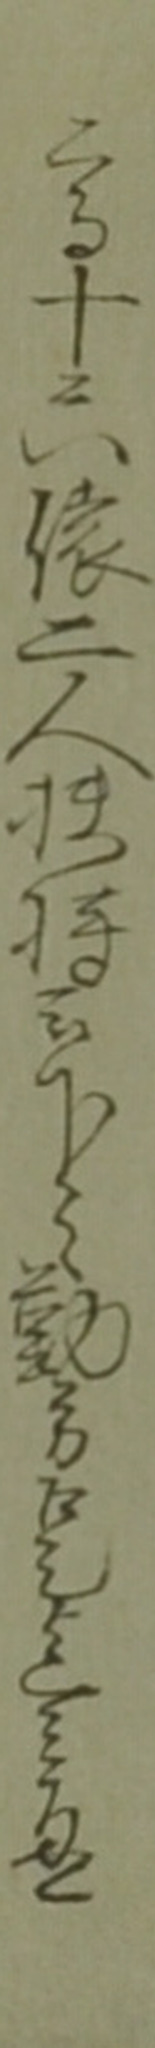高十六俵二人扶持被下之勤方是迄之通

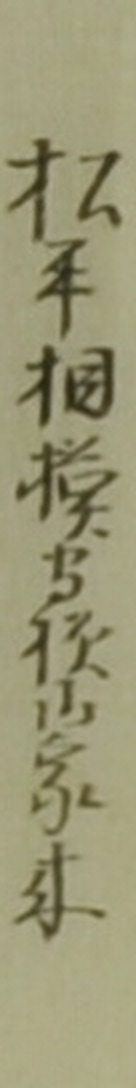松本相模守様御家来
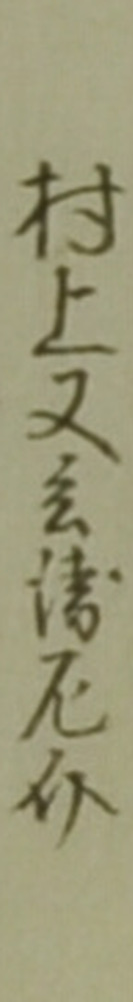村上又兵衛厄介
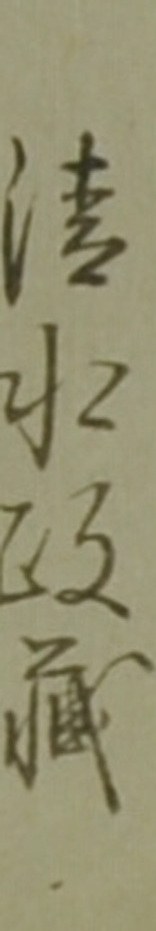清水政蔵

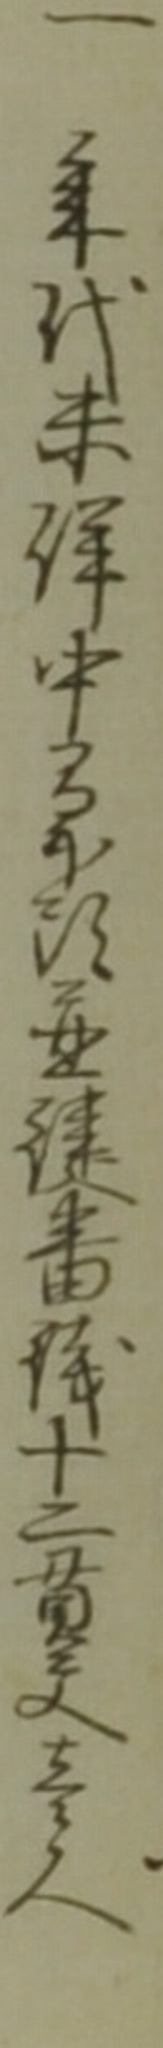一年代未詳中間小頭並鍵番銭十二貫文壱人
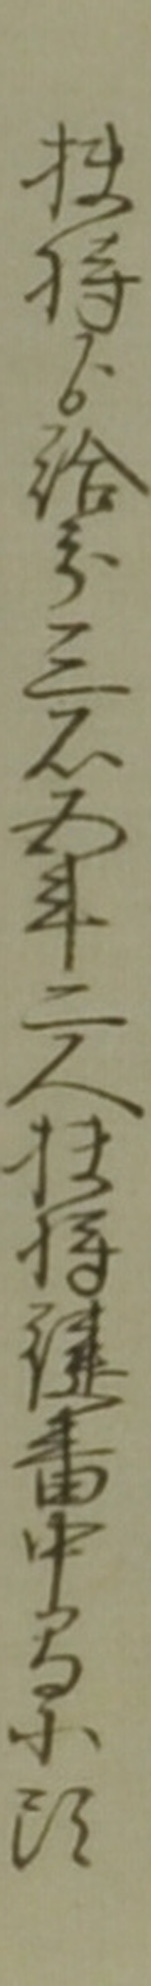扶持ゟ給分三石五斗二人扶持鍵番中間小頭
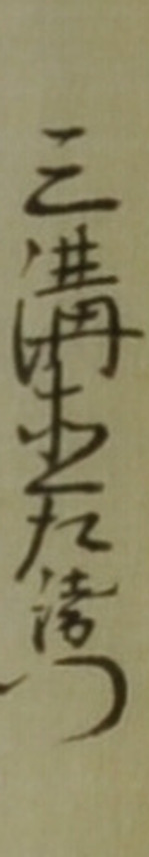三溝直左衛門
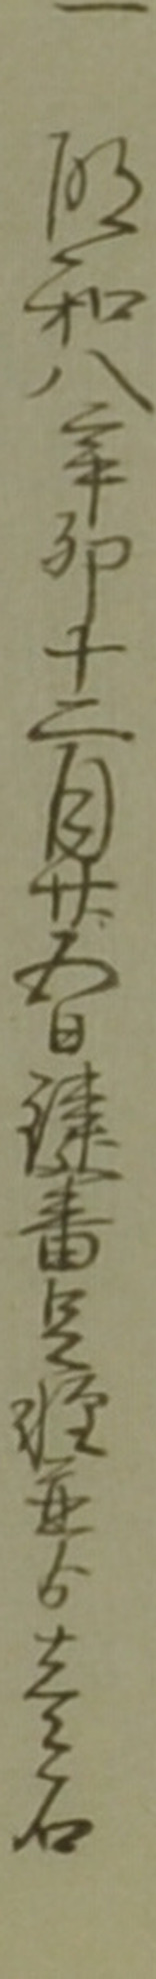一明和八辛卯十二月廿五日鍵番足軽並ゟ壱石
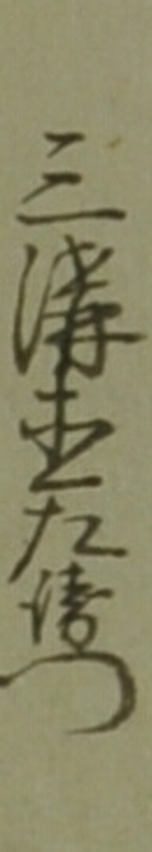三溝直左衛門
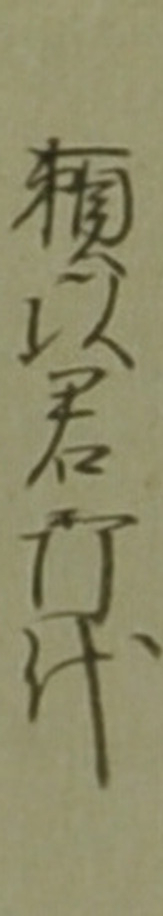頼以君御代
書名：無足諸士勤仕録（九）
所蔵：伊那市立高遠町図書館・合同会社AMANE
